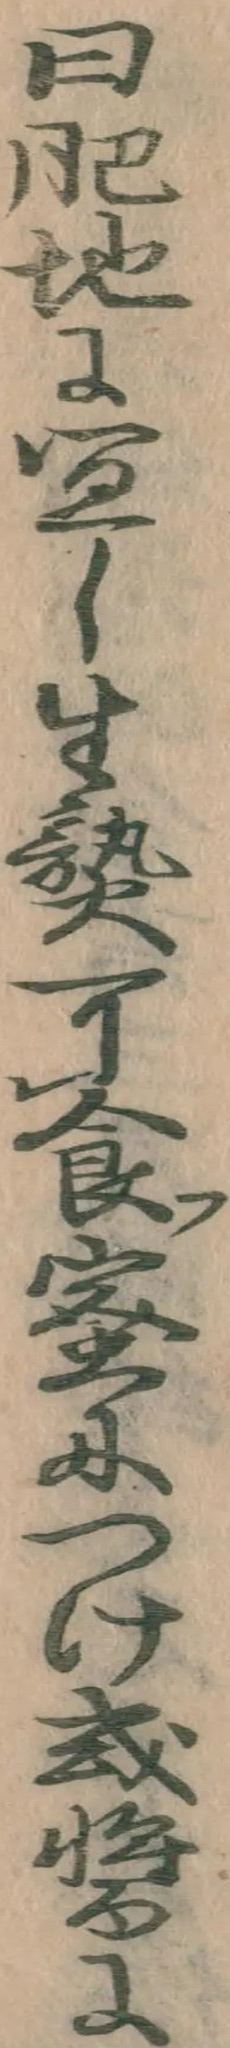日肥地に宜し生熟可食密につけ或醤に
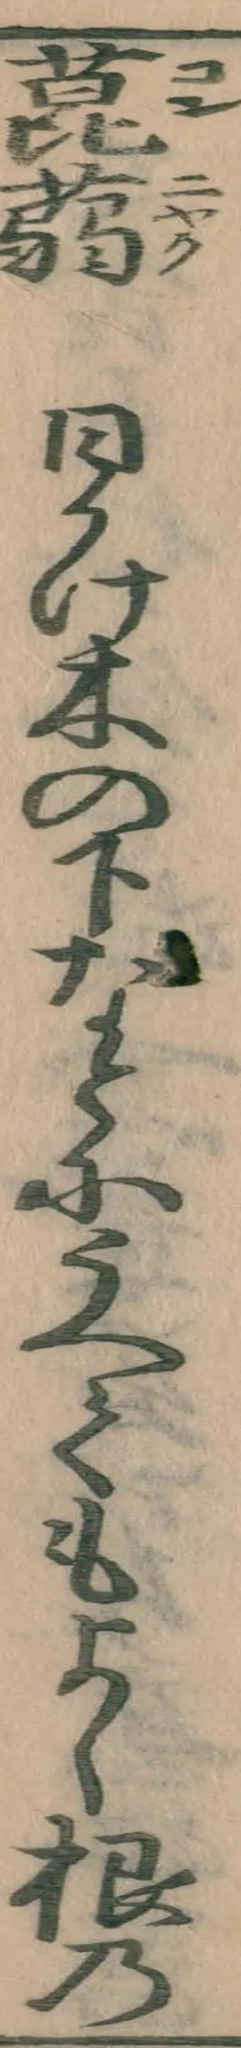蒟蒻日かけ木の下なとにうへてもよく根の
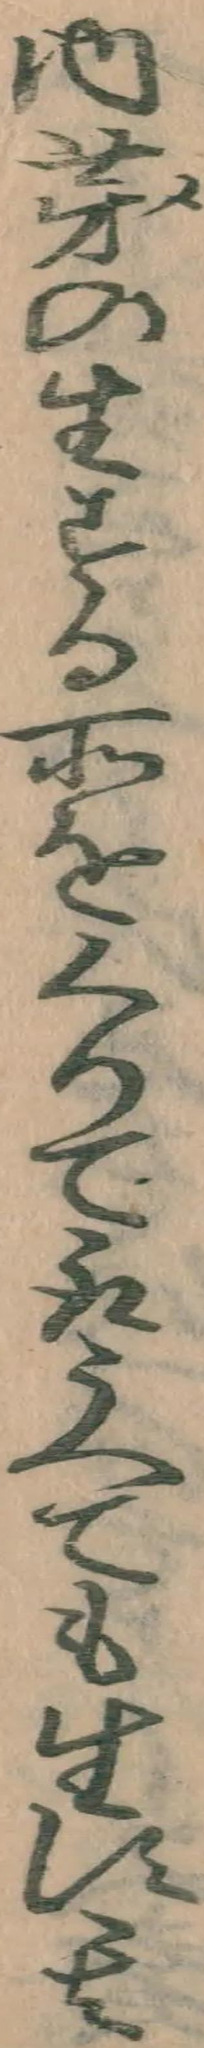内芽の生する所をくりて取うへても生す其
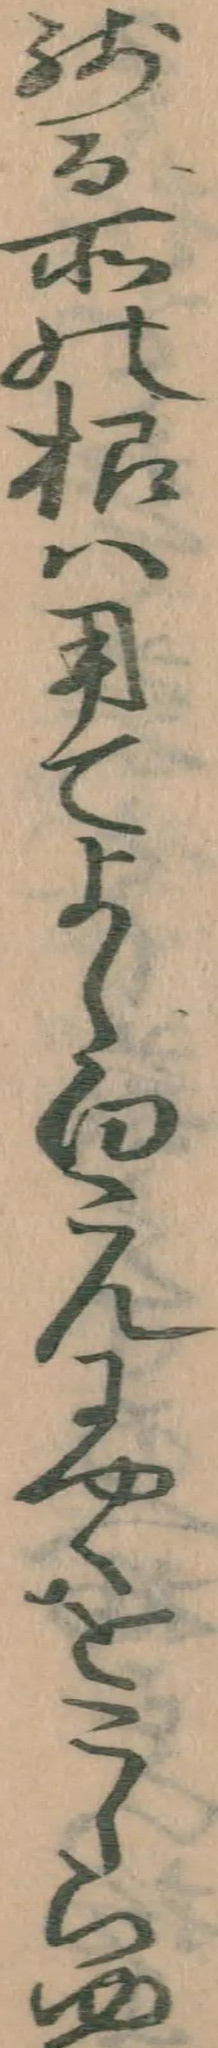残る所の根は用てよし白こんにやくをこしらゆ
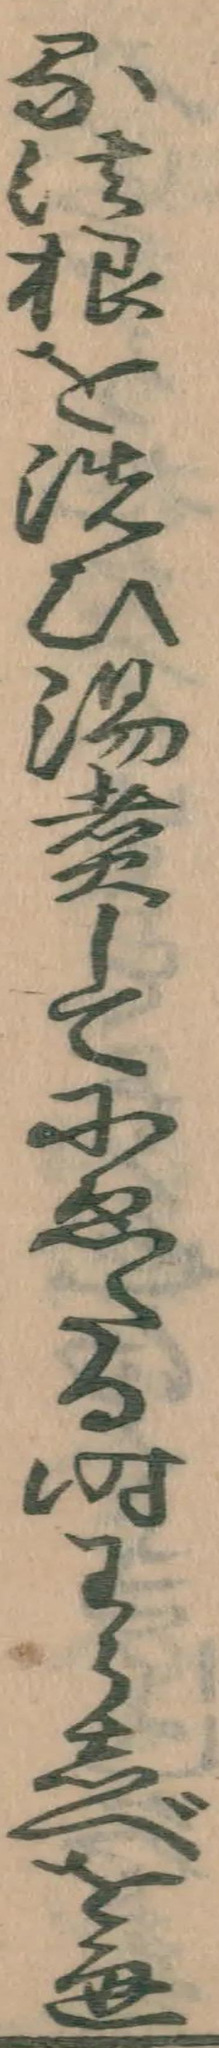る法根を洗ひ湯煮してにゑたる時わらしべを通
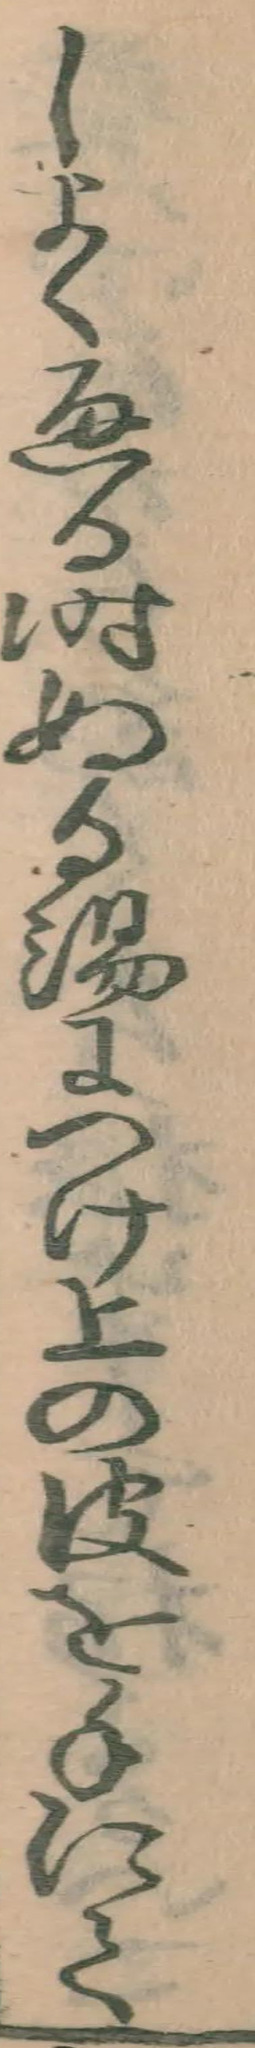しよく通る時ぬる湯につけ上の皮を手にて
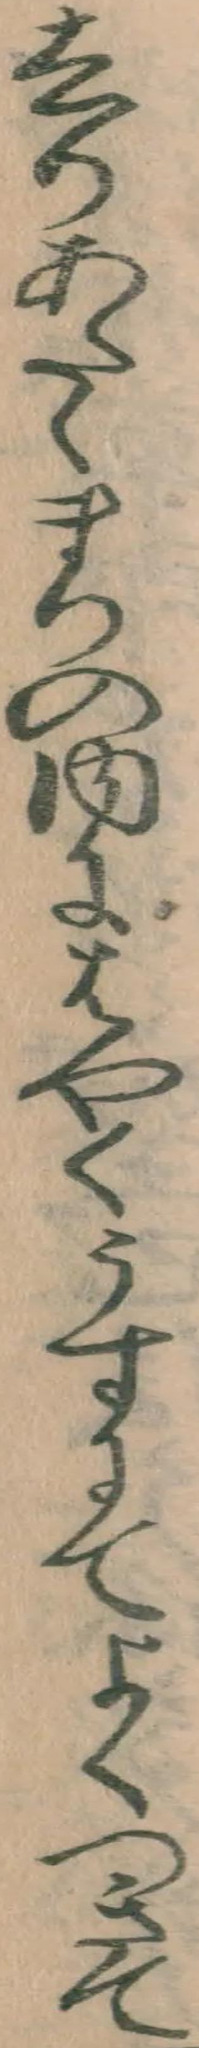去りあたゝまりの内にはやくうすにてよくつきて
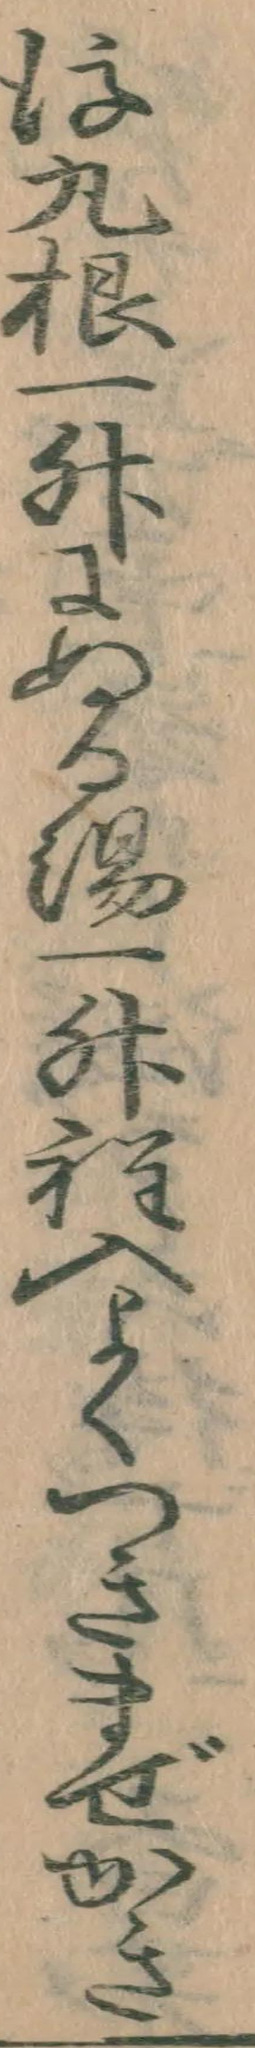後九根一升にぬる湯一升程入よくつきまぜかき
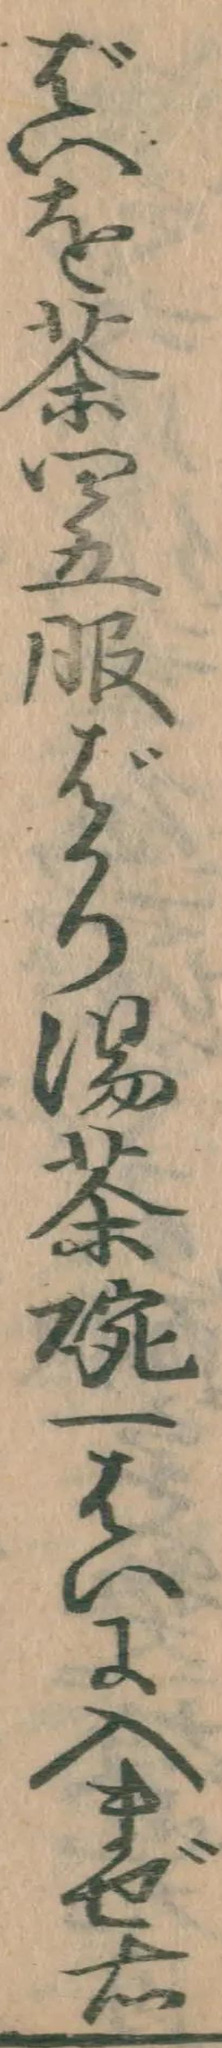はいを茶四五服ばかり湯茶碗一はいに入まぜ右
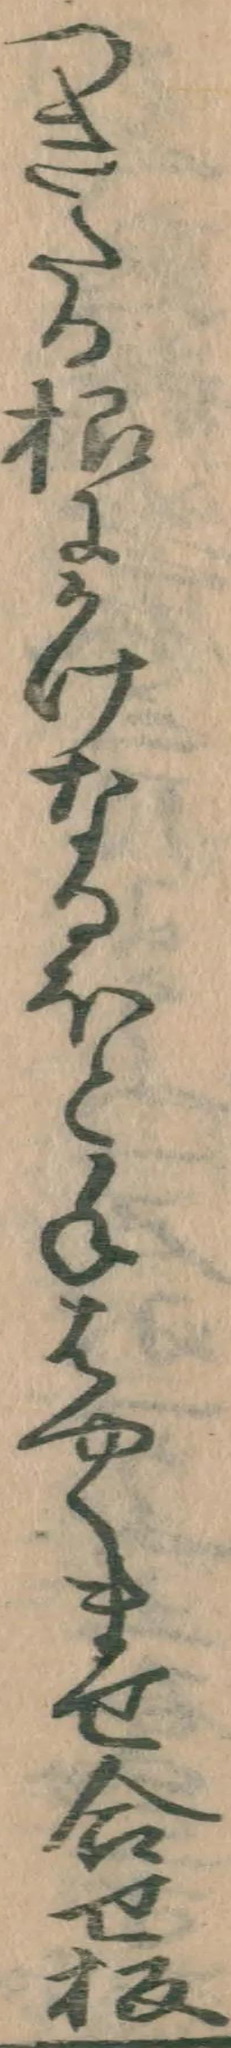つきたる根にかけなるほと手はやくませ合せ板
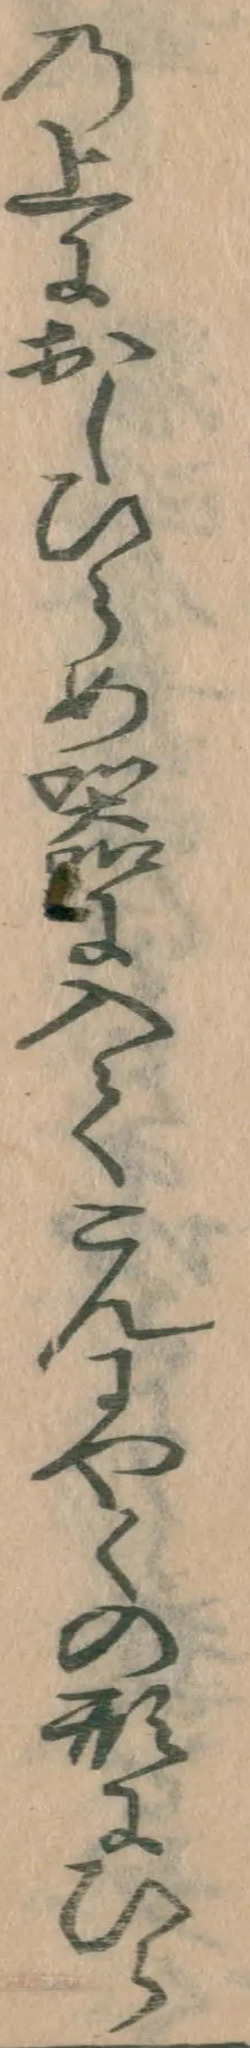の上におしひらめ器に入てこんにやくの形にひら
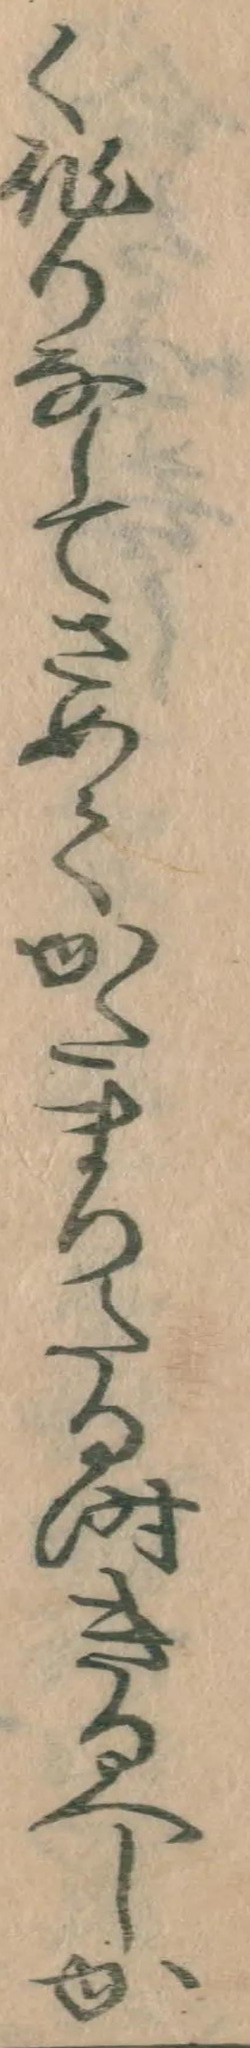く作りなしてさめてかたまりたる時きるへしか
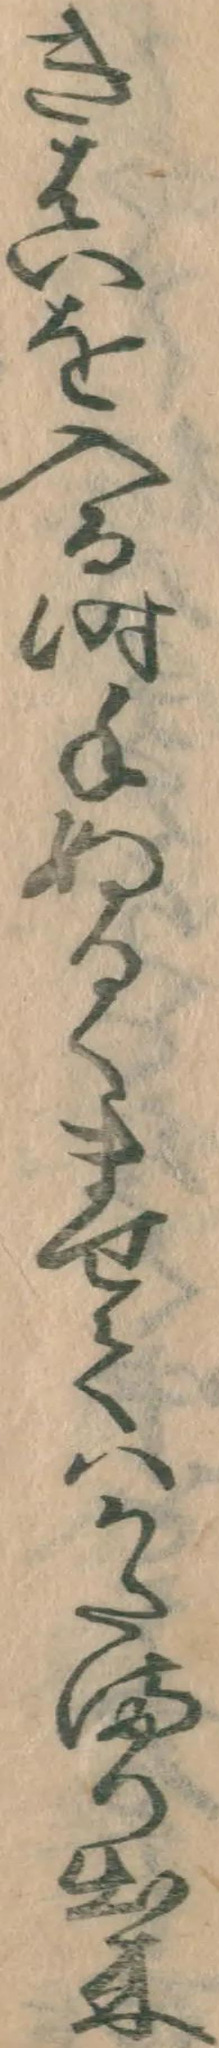きはいを入る時て手ぬるくませてはかたまり出来
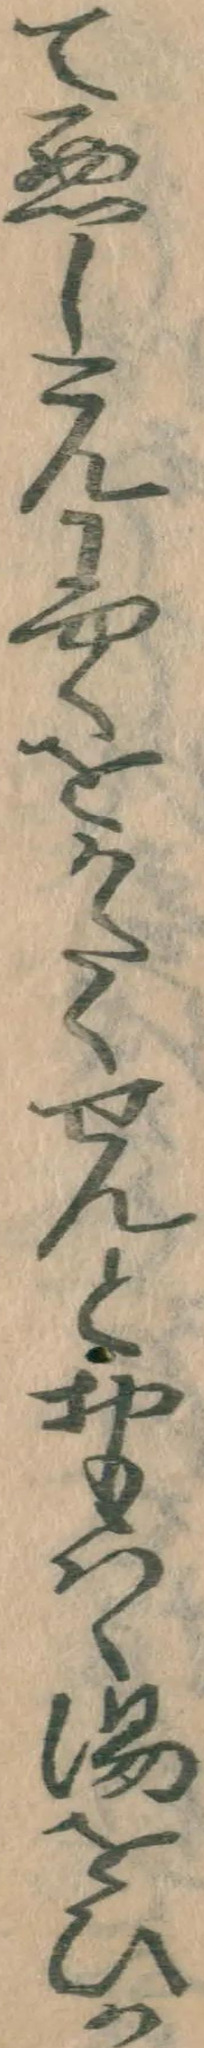て悪しこんにやくをかたくせんとおもはゝ湯をひか
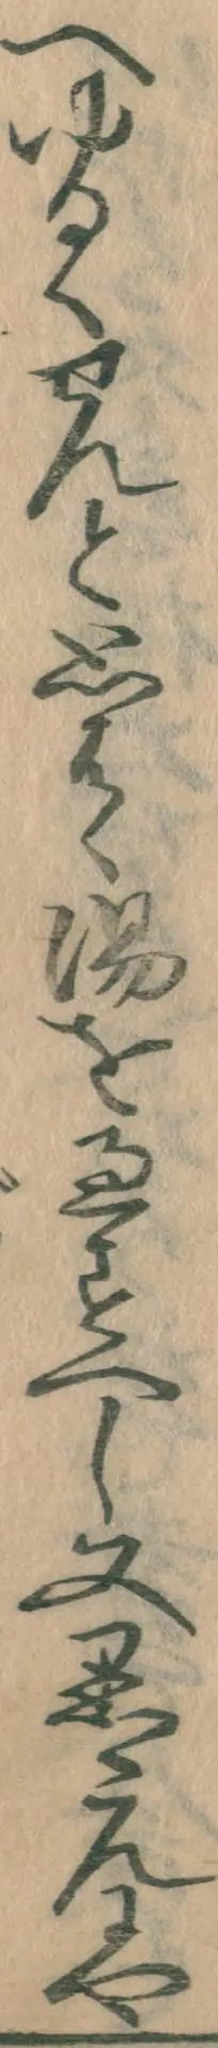へゆるくせんと思はゝ湯を過すへし又黒こんにや
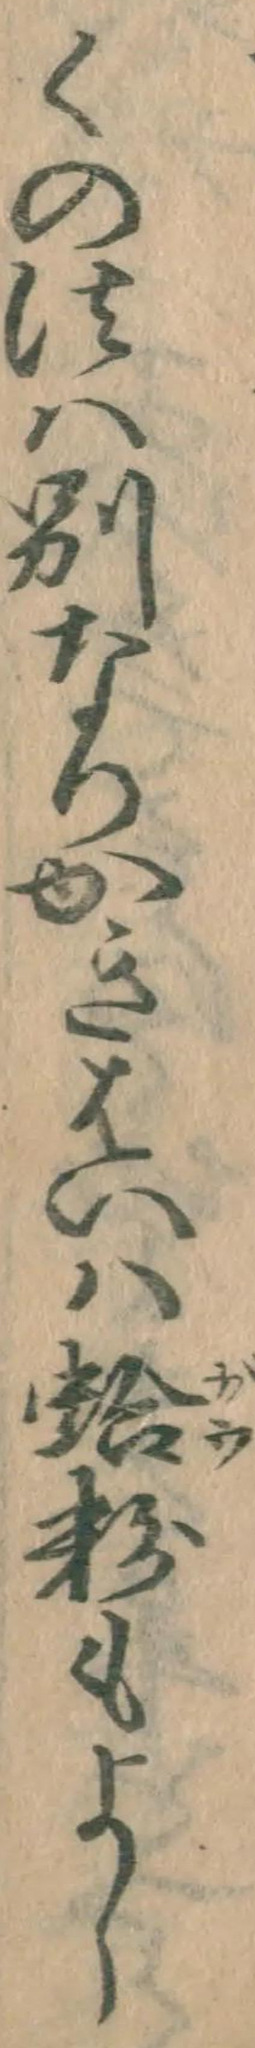くの法は別なりかきはいは蛤粉もよし
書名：菜譜 3巻
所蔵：国立国会図書館 National Diet Library, JAPAN
